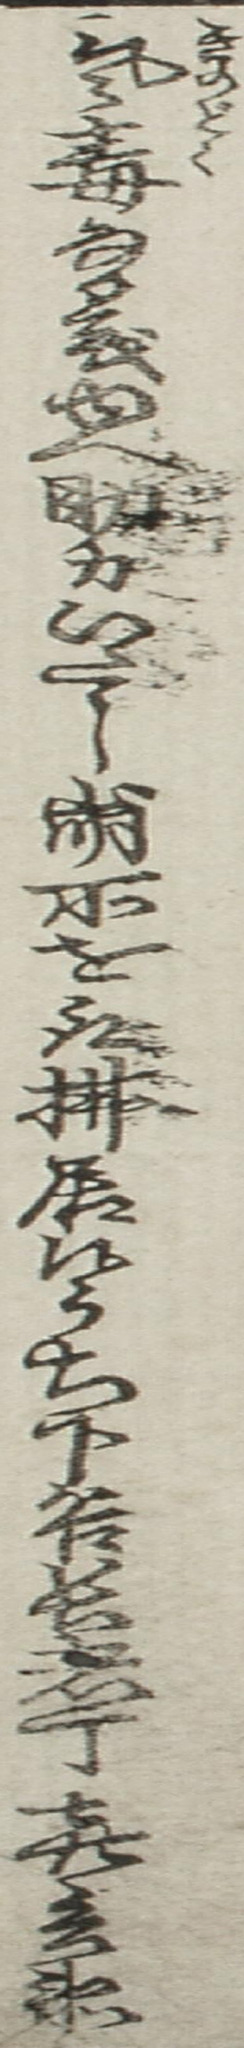気毒なる義ゆへ助力いたし崩所を取払居候うち下谷長者丁喜兵衛
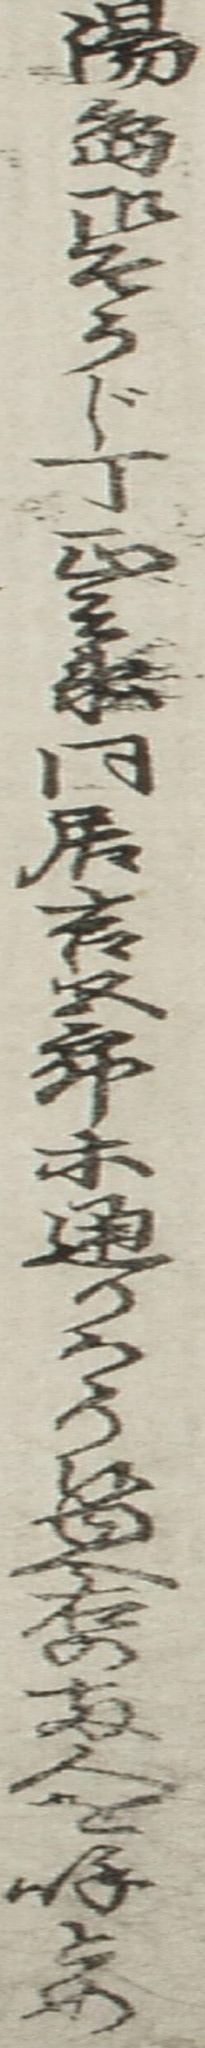湯島御そうじ丁正兵衛同居吉五郎等通りかゝり候ゆへ右の両人を呼とめ
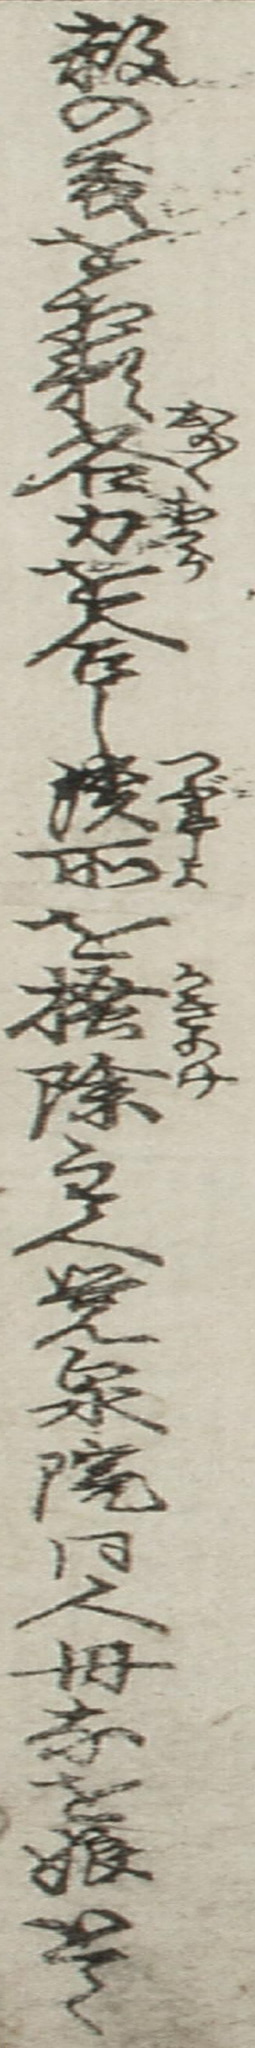赦の義を相頼各力を合し潰所を掻除主人覚泉院同人母なを娘とく
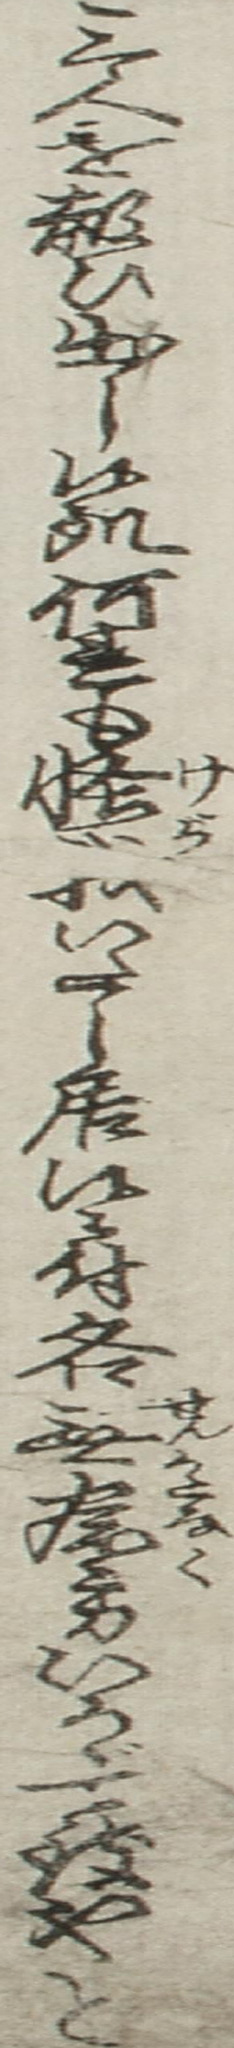三人を赦ひ出し候処何れも怪我いたし居候に付各無為方いかゞに致やと
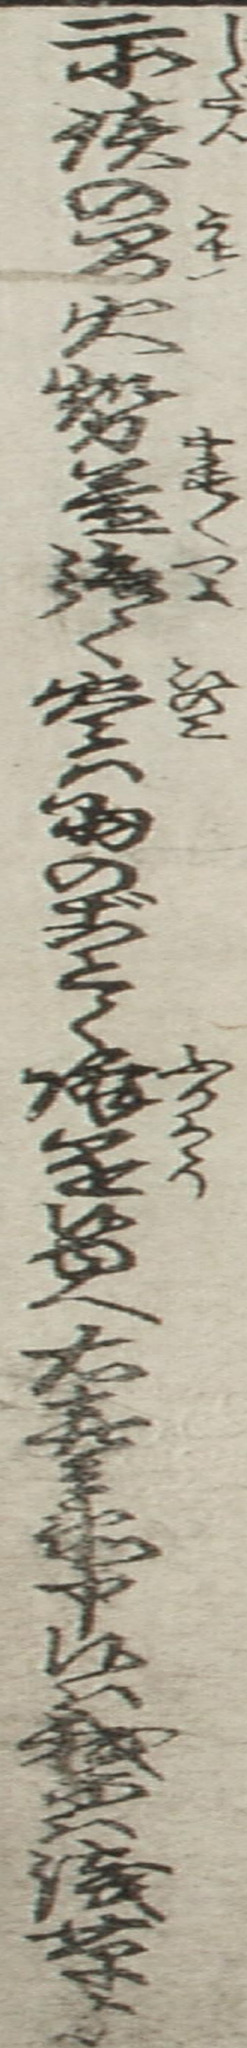示談の間火勢益強く炎は雨のごとく降懸候ゆへ右喜兵衛申候は我等は浅草迄

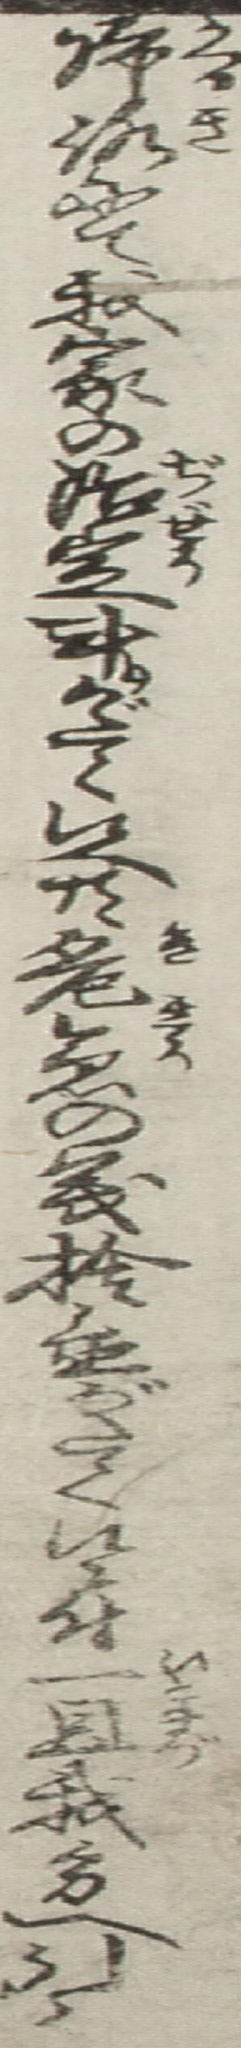帰路にて我家の治定計リがたく候へ共危急の義捨置がたく候に付一旦我方へ引上
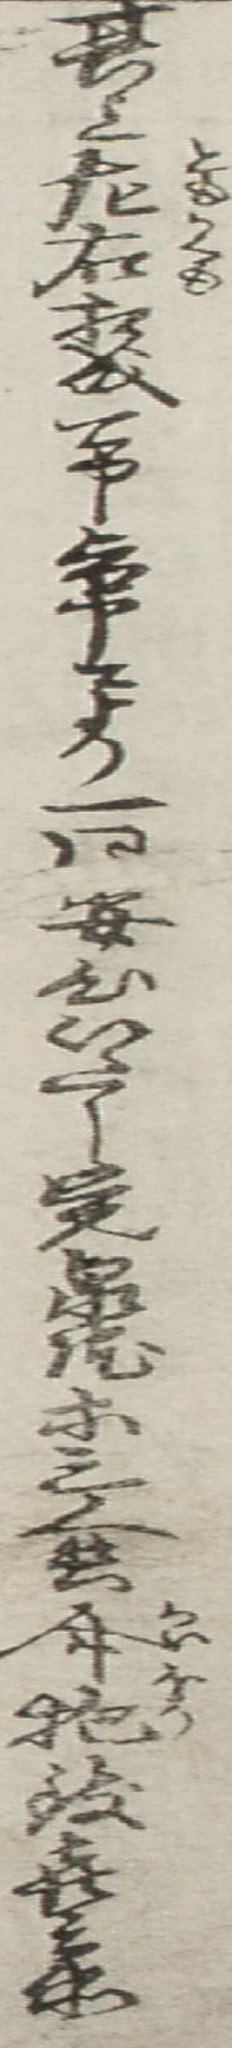其上左右相成て申旨申すにより一同安心いたし覚泉院等三人共介抱致喜兵衛
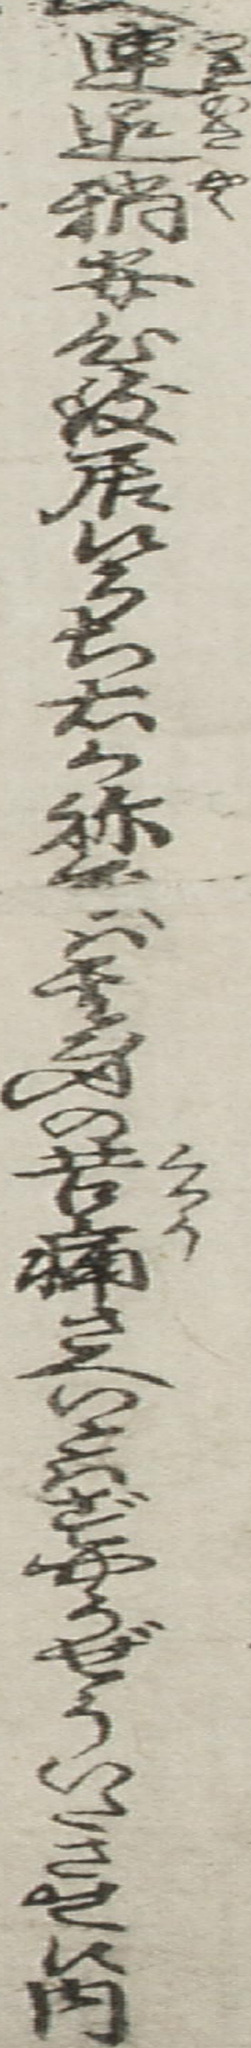へ連退稍安心致居候うち右かね義は其身の苦痛さへいとはずやうぜういたさせに内
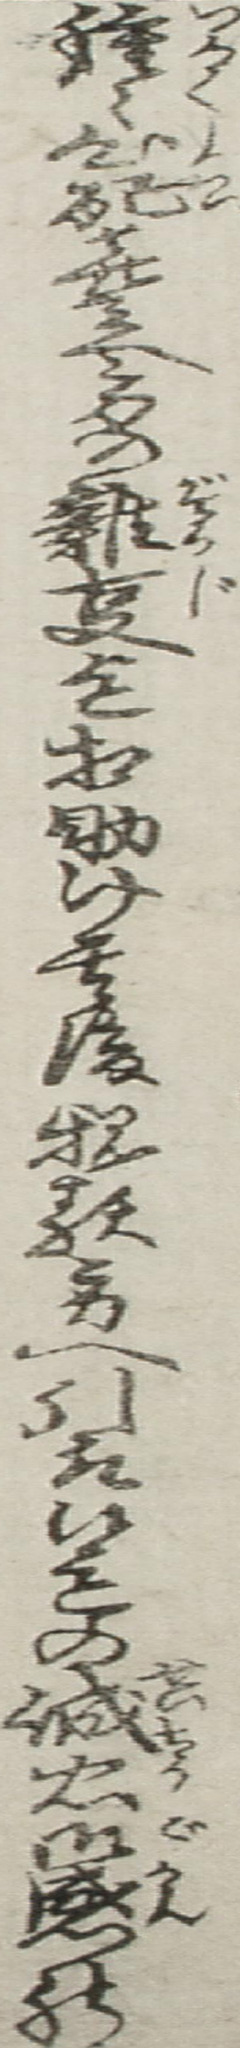種々心配喜兵へ方の雑事迄相助け其後親類方へ引取候迄の誠忠御感の
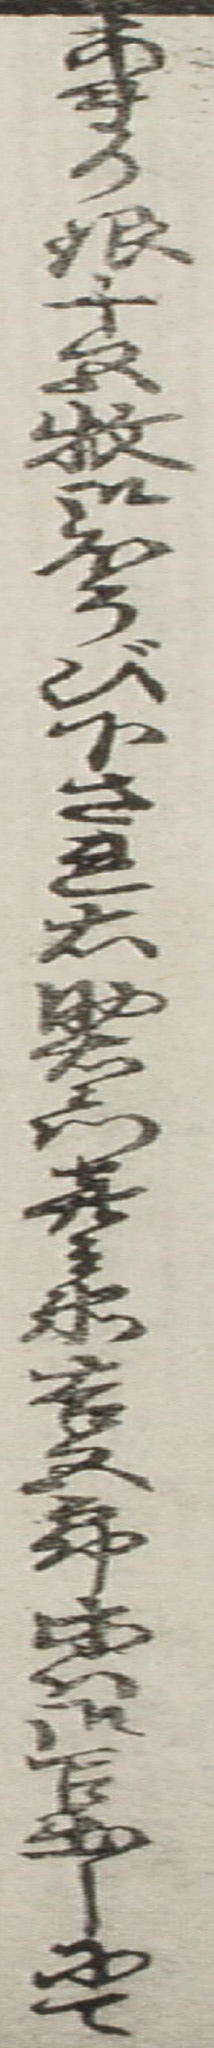あまり銀十五枚御ほうび下され右助右衛門喜兵衛吉五郎等は御召出しにて
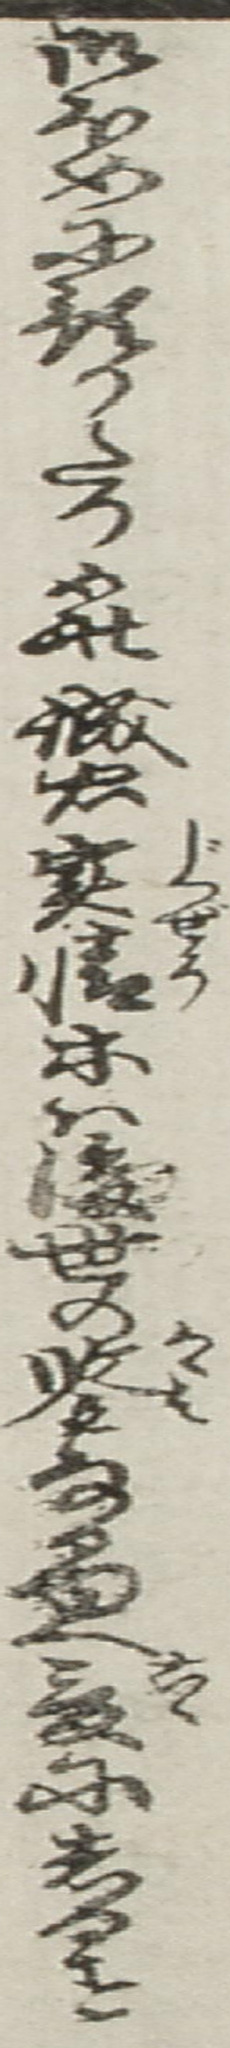御ほめに預りたり如此誠忠実情等は後世の鑑なるゆへ爰にしるす
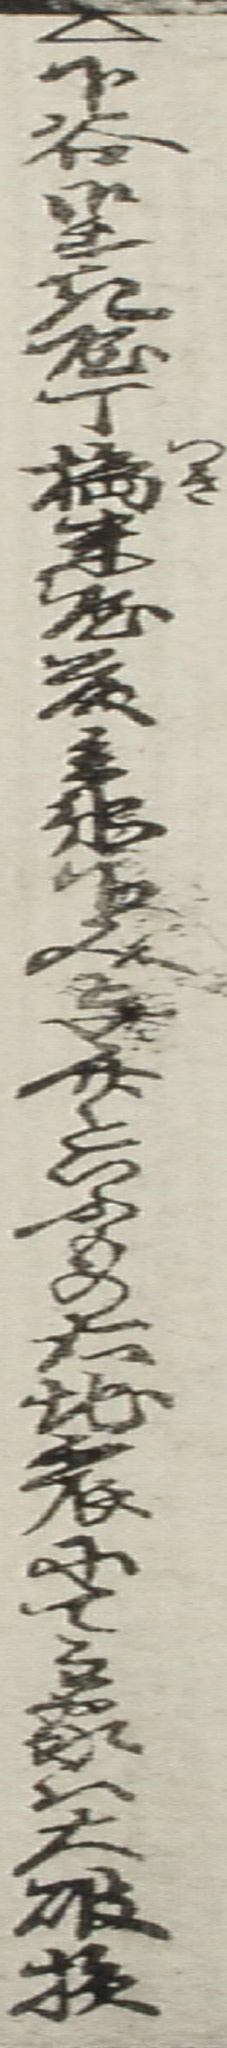△下谷御すき屋丁搗米屋藤兵衛下介与介といふもの右地震にて主家は大破損
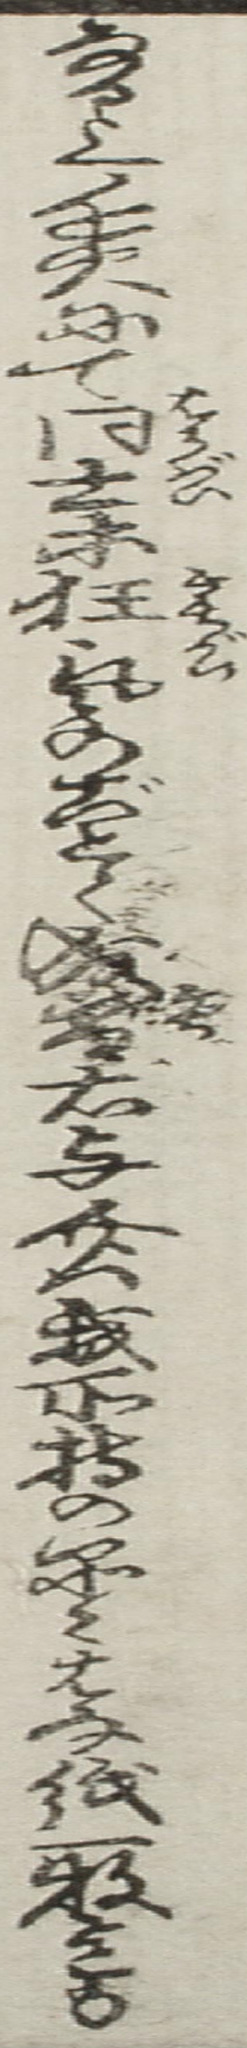なる上近火にて同士等狂気のごとく成候内右与介は我所持の品々はな紙一枚迄も
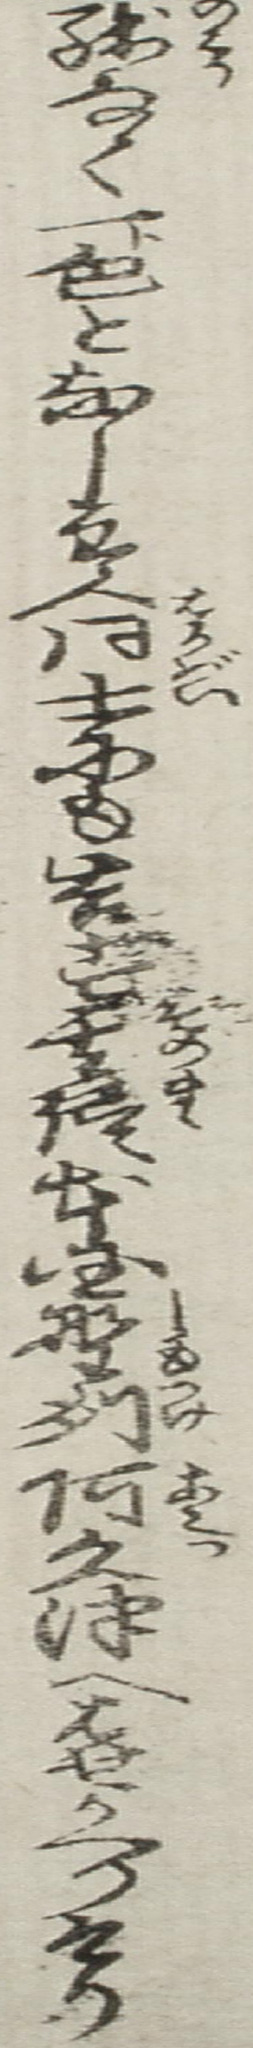残なく一ト包となし主人同士にも告す其侭本国野州阿久津へはせかへりけり
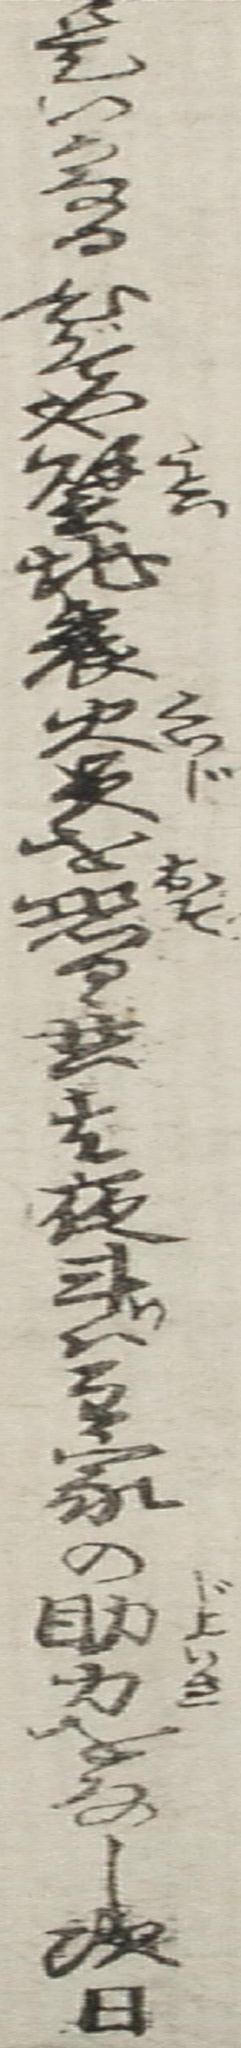是いかなる心ぞや譬地震火災を恐るゝ共其夜計りは主家の助力をなし次日
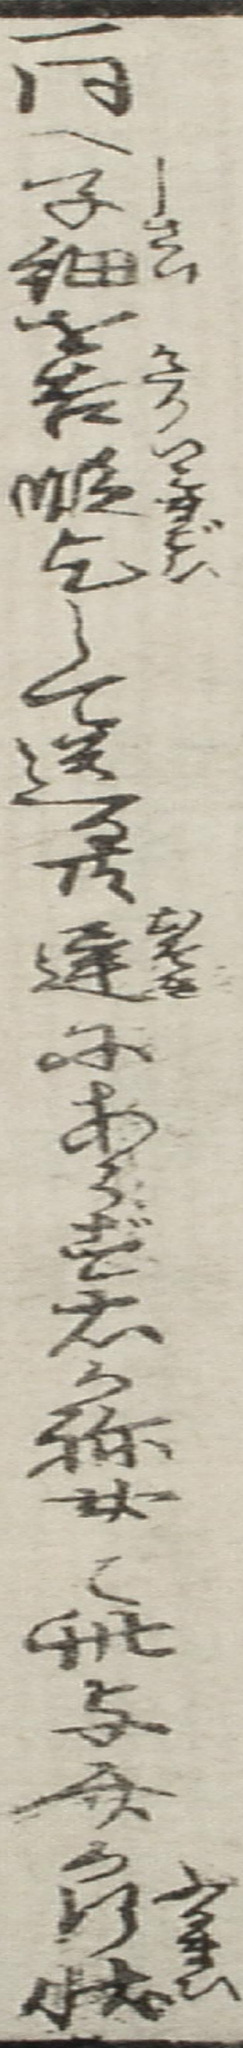一同へ子細を告暇乞して送る共遅にあらず右かね女と此与介の行状
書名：安政見聞誌　下
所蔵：東京大学地震研究所図書室 Earthquake Research Institute Library, The University of Tokyo, JAPAN
